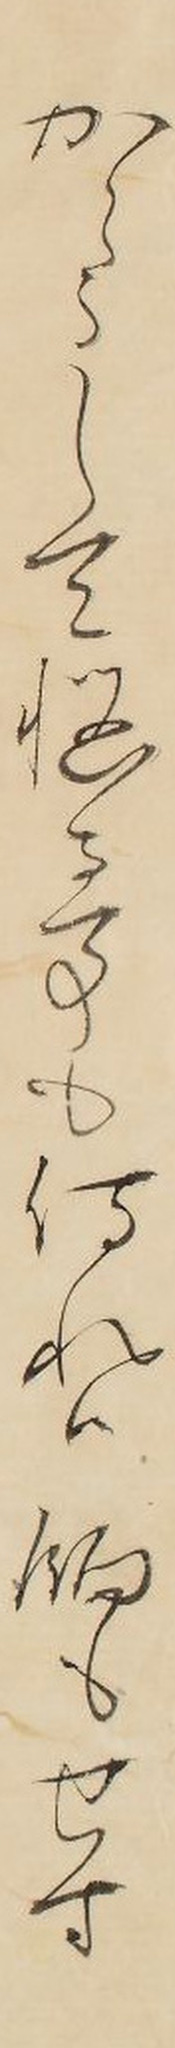からうして悩る事も侍れは餉もせす
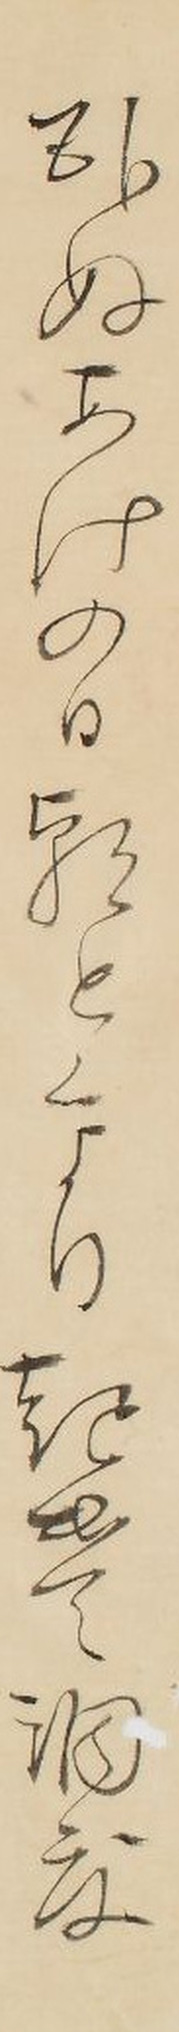卧ぬあけの日朝とくより起出て調度
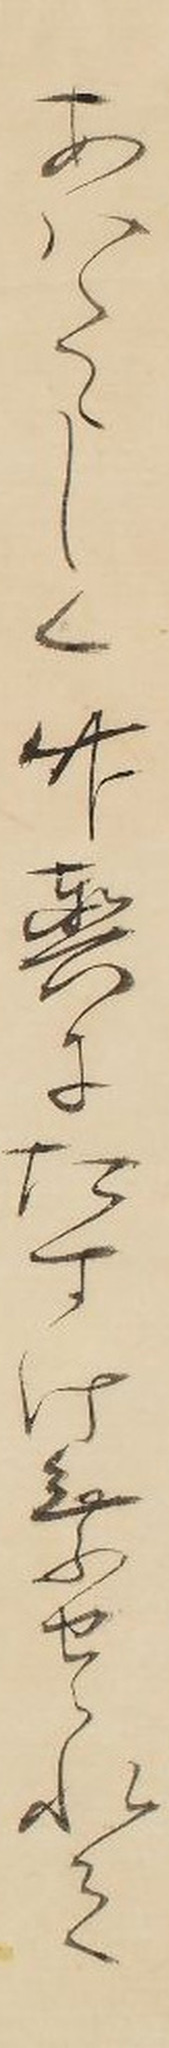あはたゝしく竹輿にたすけ乗せられて
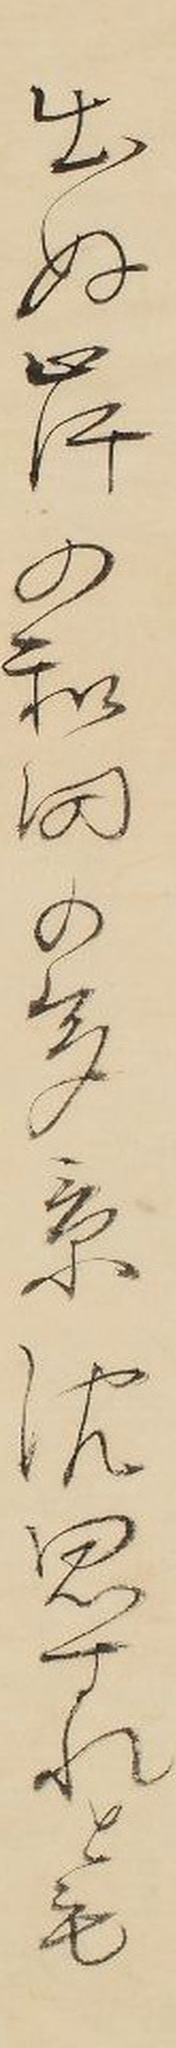出ぬ岸の和田の多景沈思すれとも
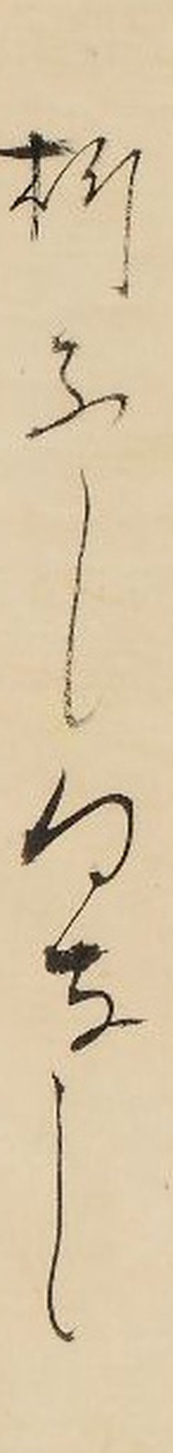折ふし句なし
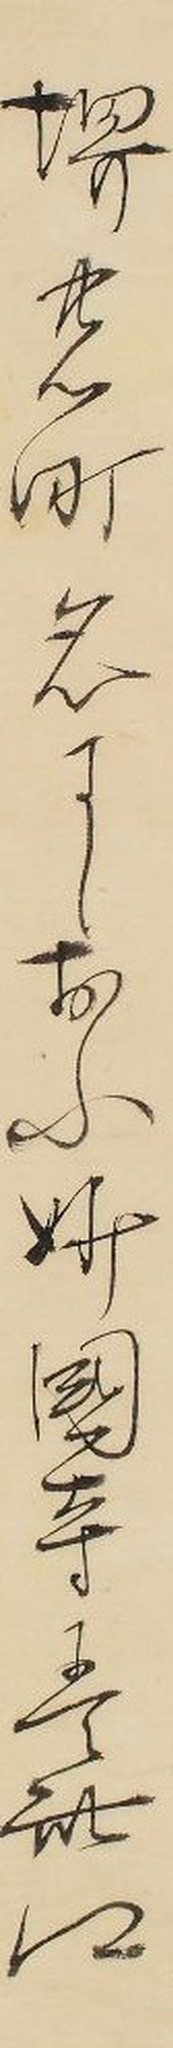堺の町名にしおふ妙国寺まて此郷
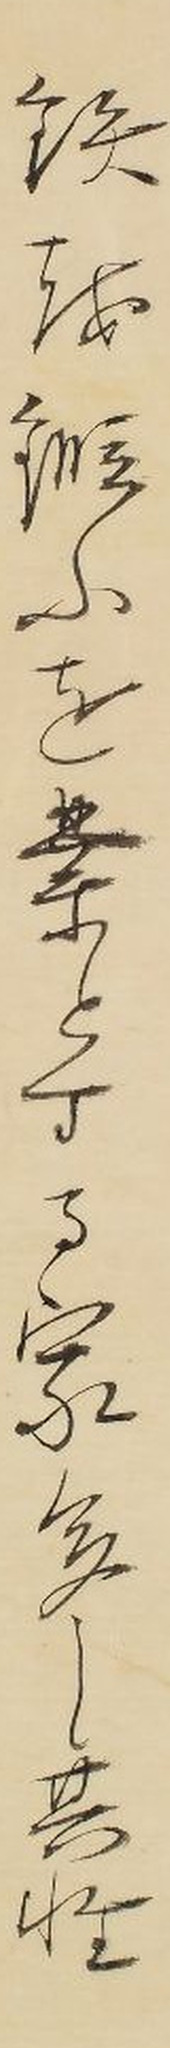鉄を鍛ふを業とする家多し其性
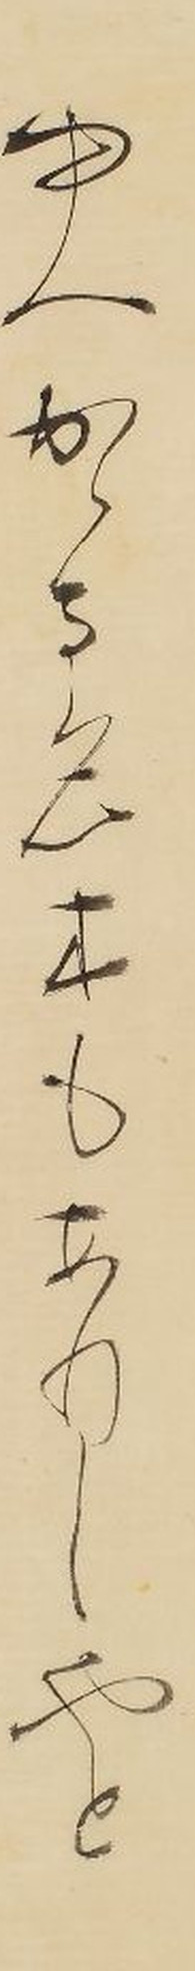ゆへかゝる名木もありしやと
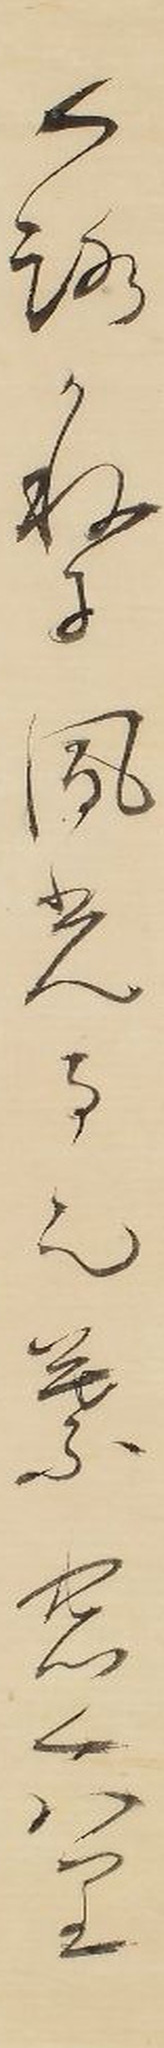くろかねに風光る也葉のくはり
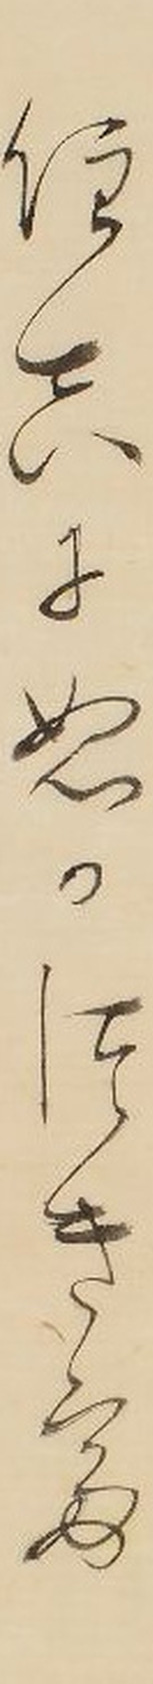住吉にぬかつきて
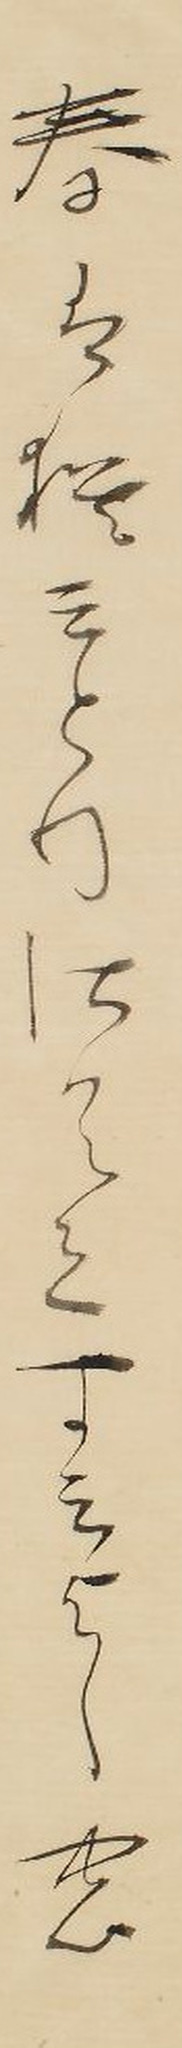春は猶みとりさかえてすみよしの
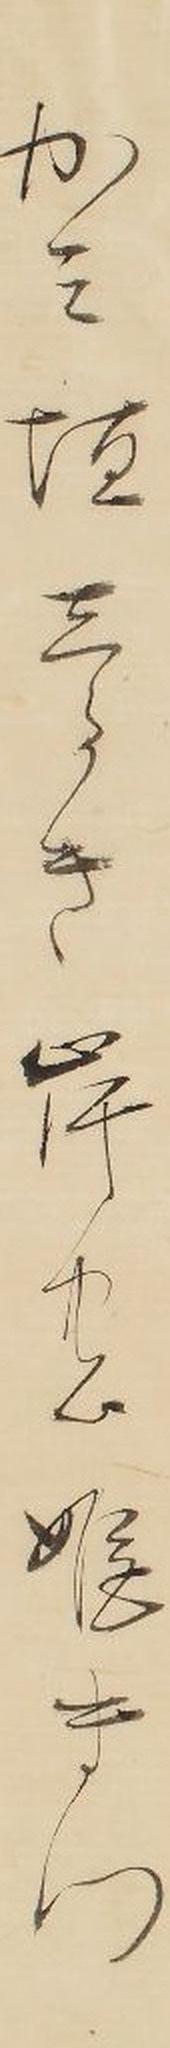かみ垣しるき岸の姫まつ
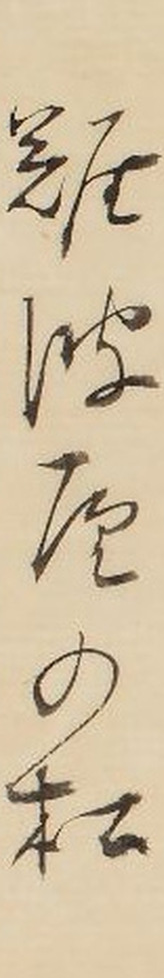難波屋の松
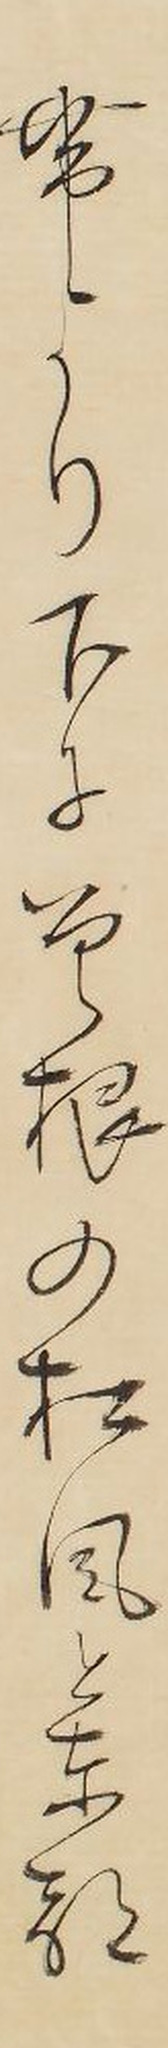帯より下に曽根の松風と東都
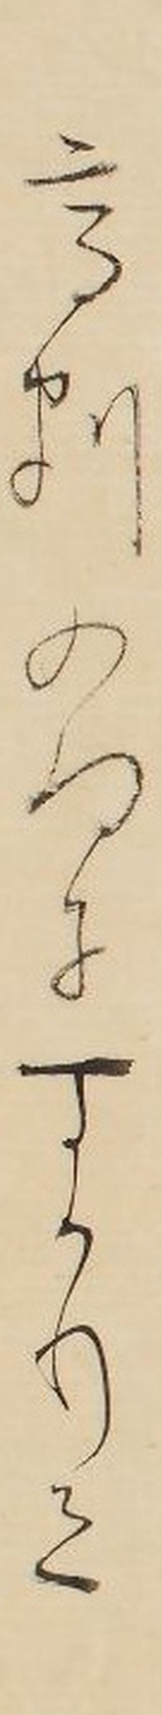高判の句にすかりて
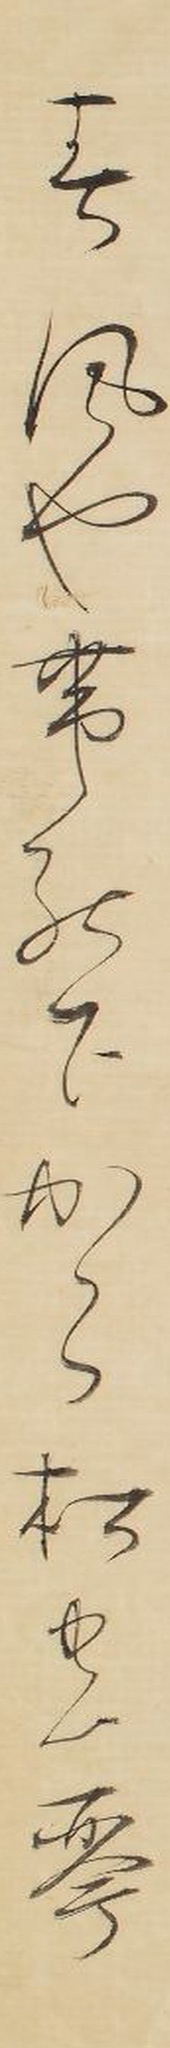春風や帯の下から松の琴
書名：花土産
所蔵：徳島県立図書館
